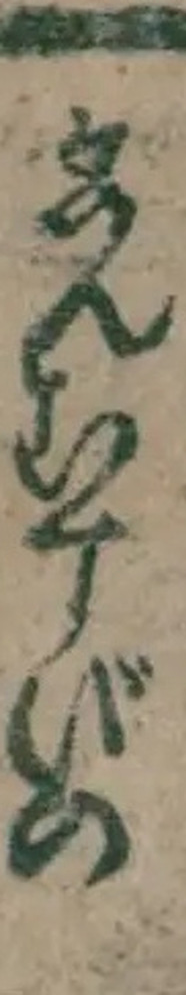えんむすびの
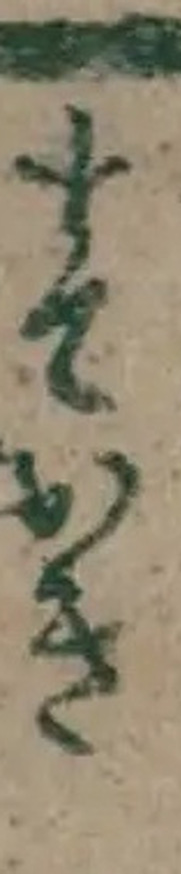すておき
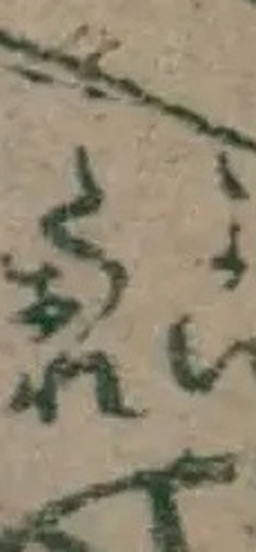たおれ
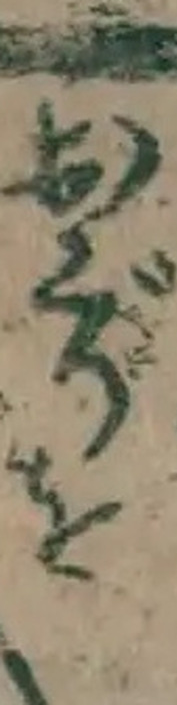おごりを
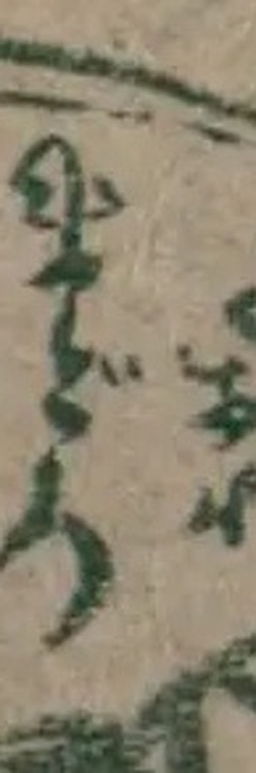まどろ
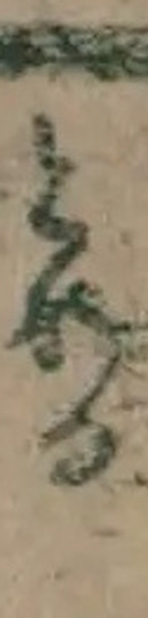とれる
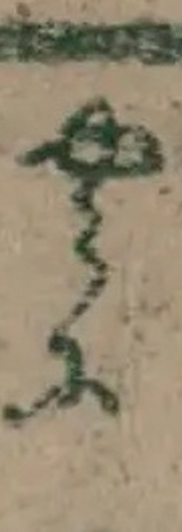やうに
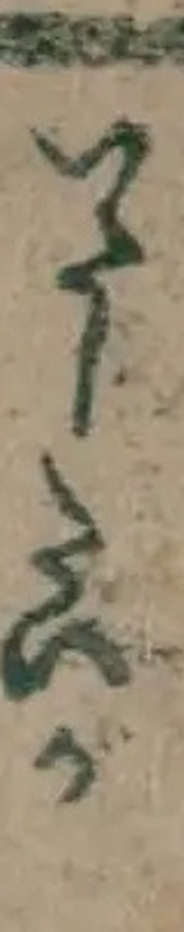いたしたいが
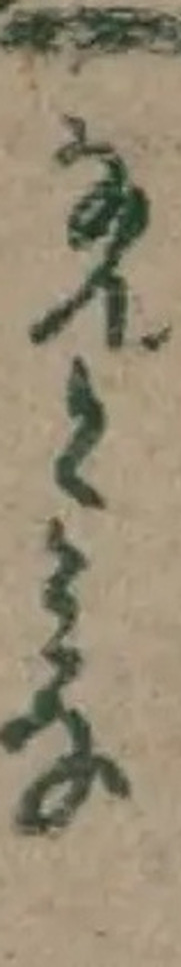なんとみな
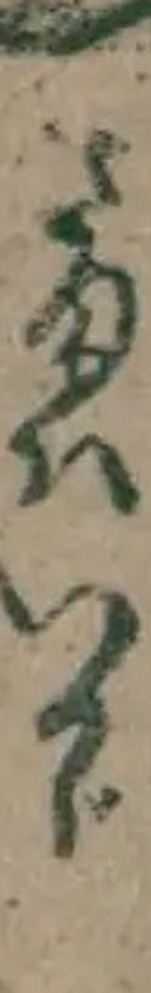さまはいかゞ
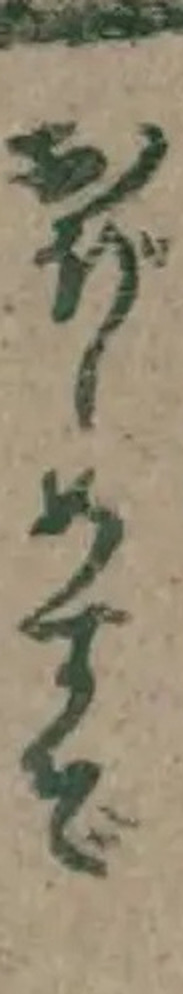おぼしめすと
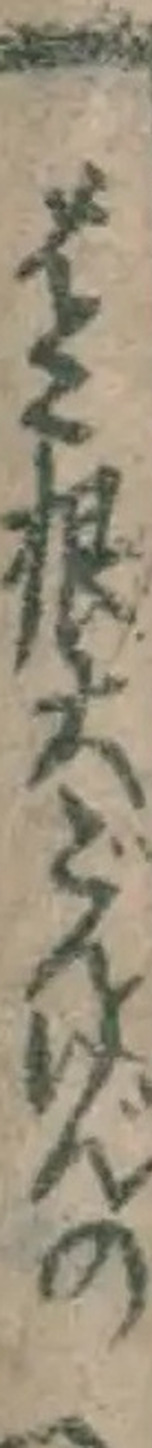はこ根大ごんげんの
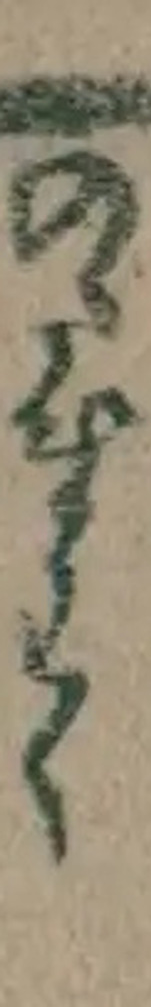のたまわく
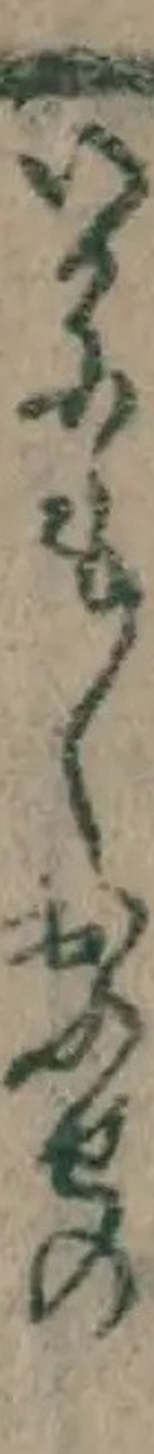いかにも〳〵おふせの
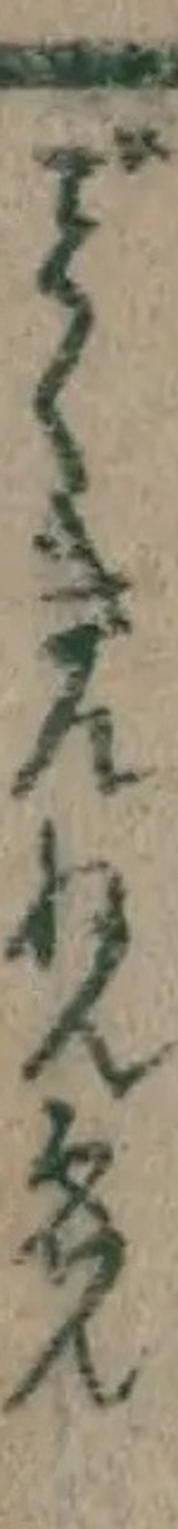ごとくきんねんえん
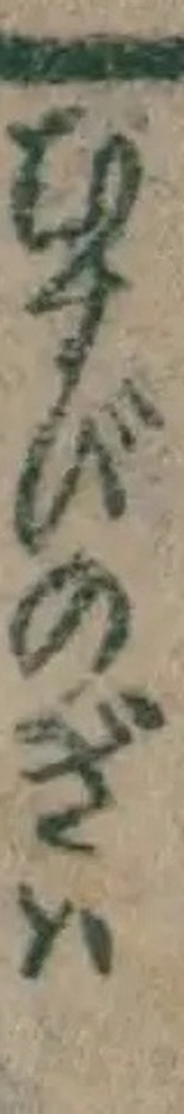むすびのぎは
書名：頓作時雨月 3巻
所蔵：国立国会図書館 National Diet Library, JAPAN
